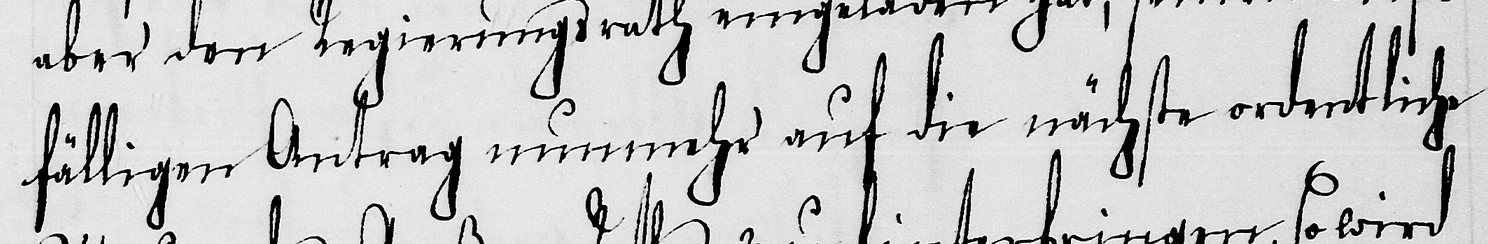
fälligen Antrag nunmehr auf die nächste ordentliche
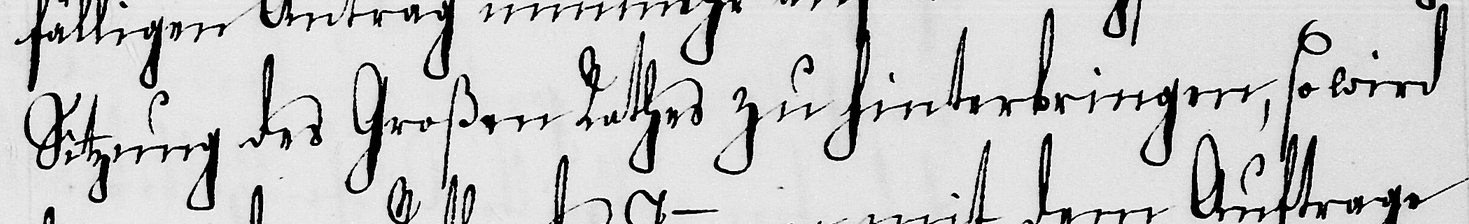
Sitzung des Große Rathes zu hinterbringen, so wird
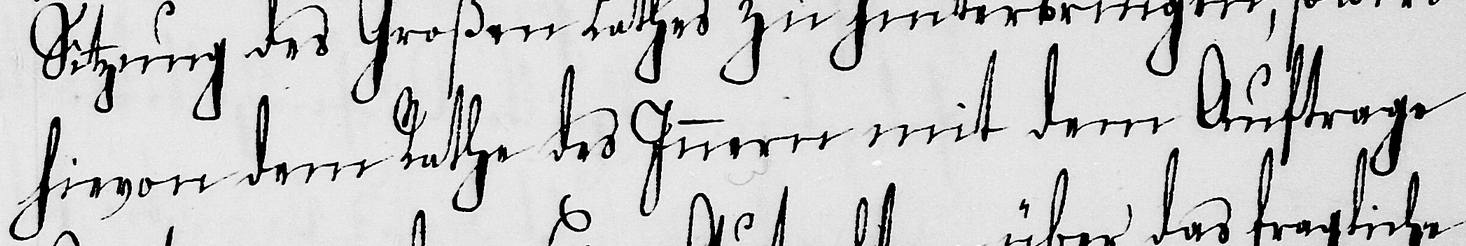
hievon dem Rathe des Innern mit dem Auftrage
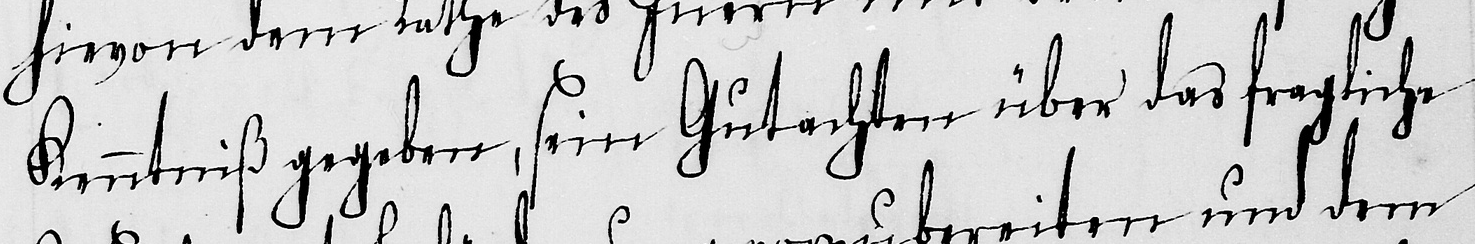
Kenntniß gegeben, sein Gutachten über das fragliche
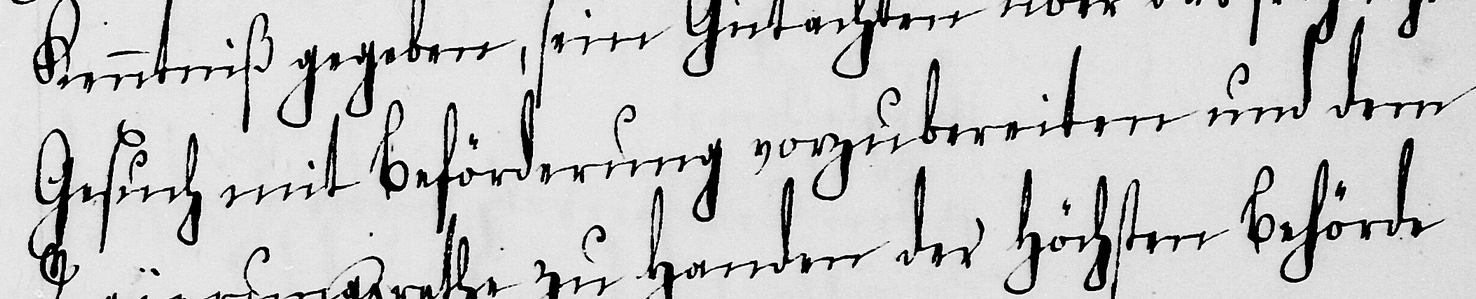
Gesuch mit Beförderung vorzubereiten und dem
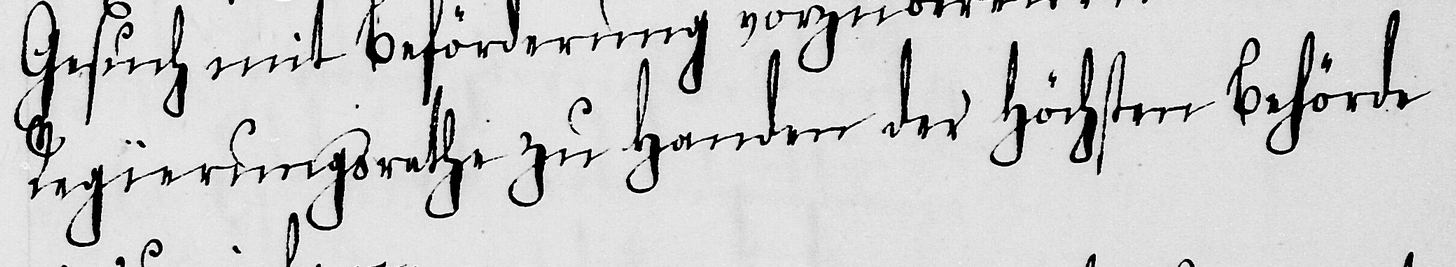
Regierungsrathe zu Handen der höchsten Behörde
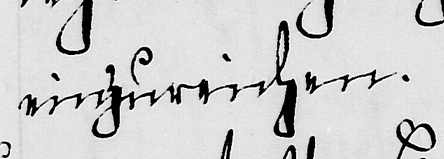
einzureichen.
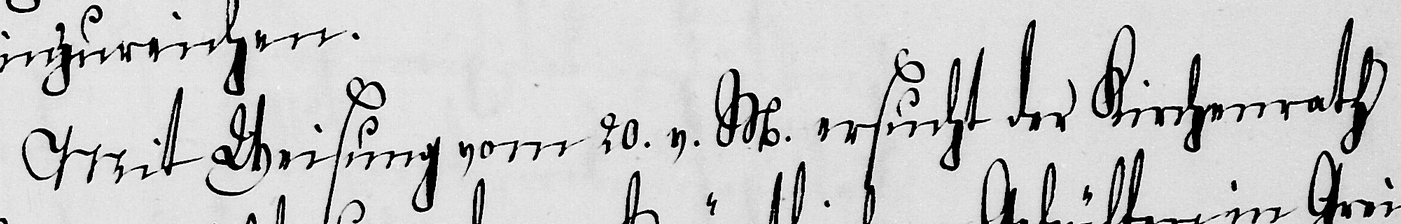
Mit Weisung vom 20. v. M. ersucht der Kirchenrath
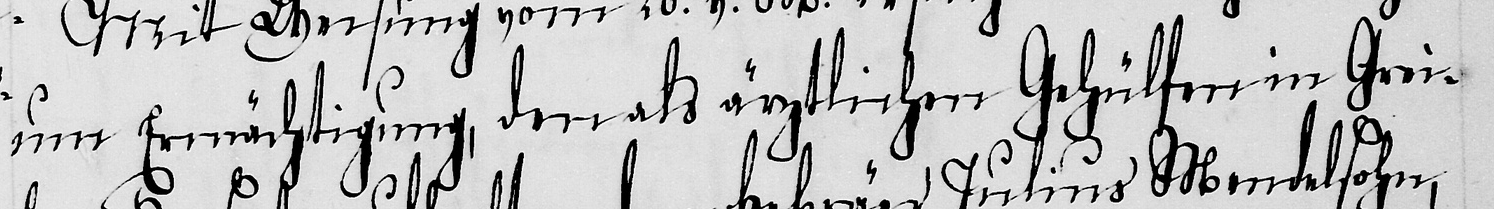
um Ermächtigung, den als ärztlichen Gehülfen in Grei¬
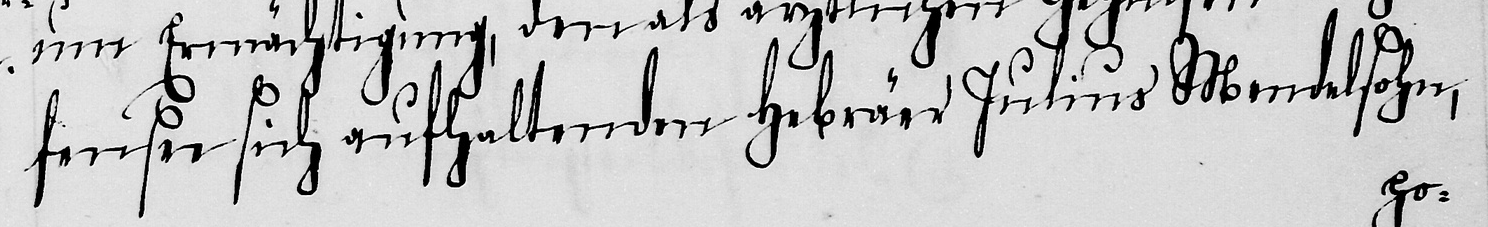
fensee sich aufhaltenden Hebräer Julius Mendelsohn,
